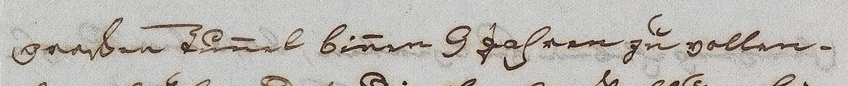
großen Tunnel binnen 9 Jahren zu vollen-
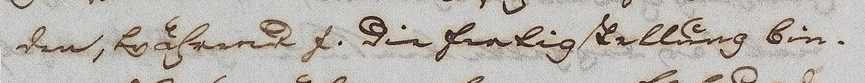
den, während F. die Fertigstellung bin-
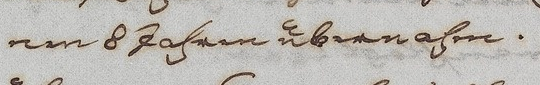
nen 8 Jahren übernahm.
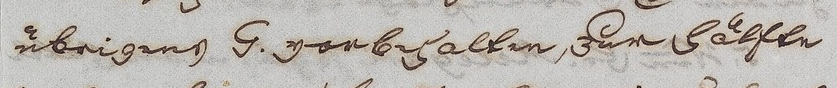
übrigens G. vorbehalten, zur Hälfte
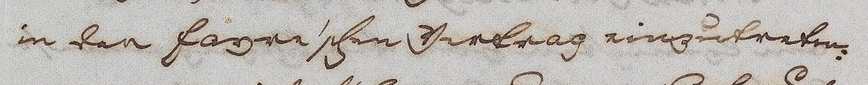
in den Favre'schen Vertrag einzutreten,
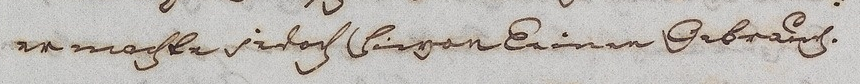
er machte jedoch hievon keinen Gebrauch.
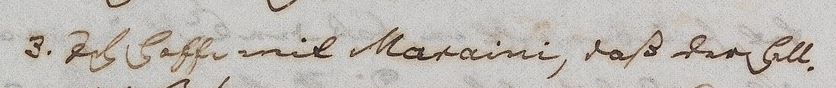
3. Ich hoffe mit Maraini, daß der Hell-
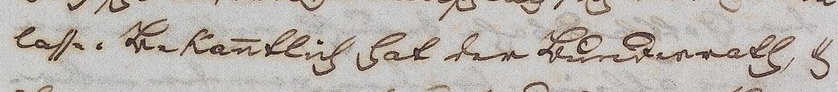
lasse. Bekanntlich hat der Bundesrath, &
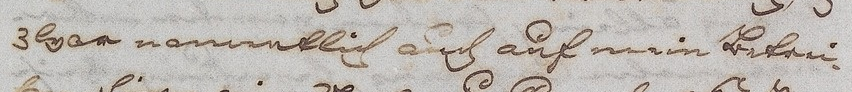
zwar namentlich auch auf mein Betrei-
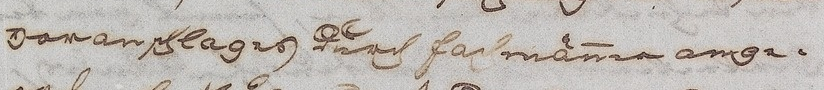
voranschlages durch Fachmänner ange-
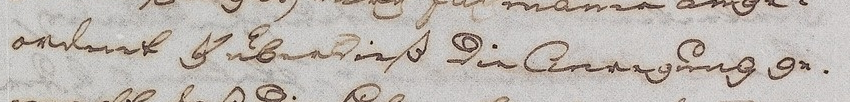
ordnet & überdieß die Anregung ge-
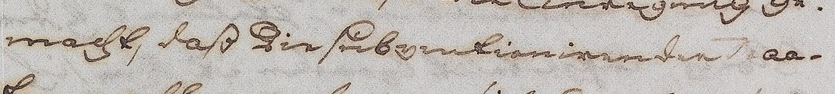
macht, daß die subventionierenden Staa-
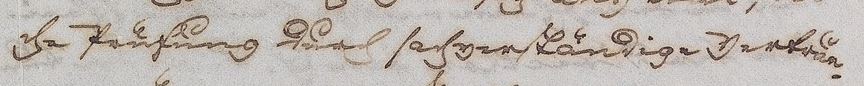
che Prüfung durch sachverständige Vertrau-
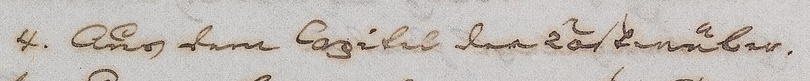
4. Aus dem Capitel der Kostenüber-
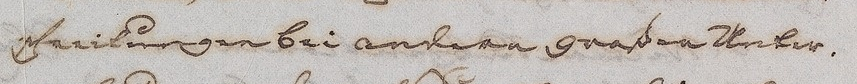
schreitungen bei andern großen Unter-
